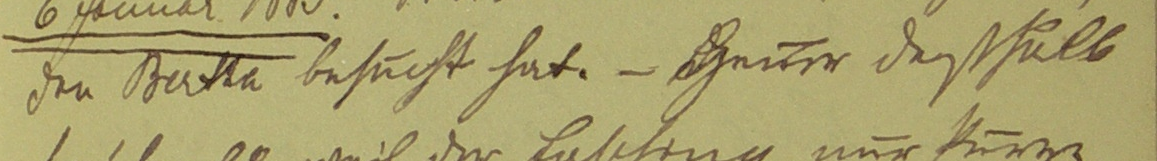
den Bertha besucht hat. Heuer deshalb
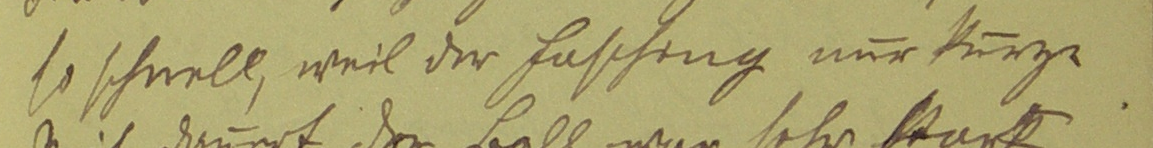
so schnell weil der Fasching nur kurze
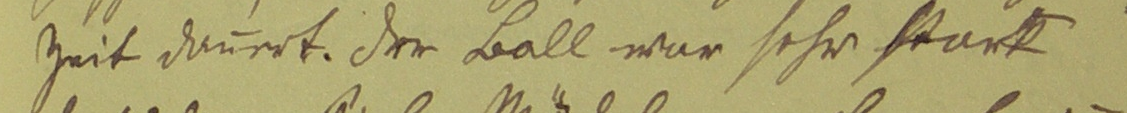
Zeit dauert. Der Ball war sehr stark
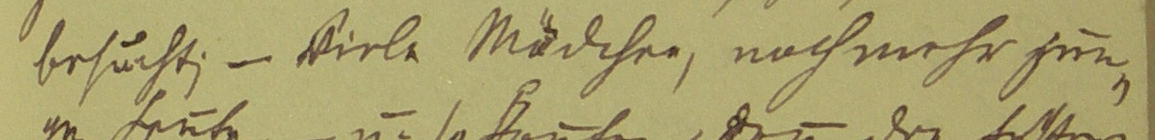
besucht, - viele Mädchen, noch mehr jun¬
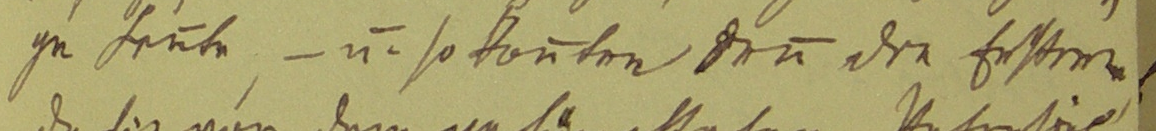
ge Leute ,- und so konnten denn die Ersteren
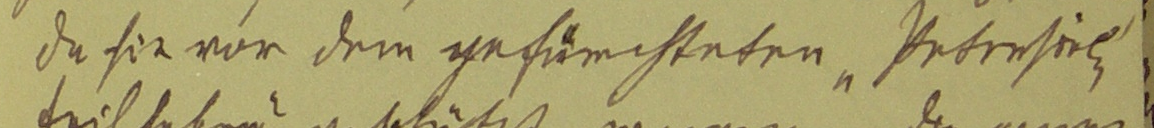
da sie vor dem gefürchteten „ ? Petersönhn¬
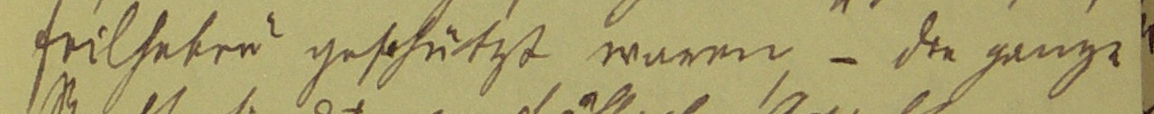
feilseken….“ geschützt waren, -die ganze
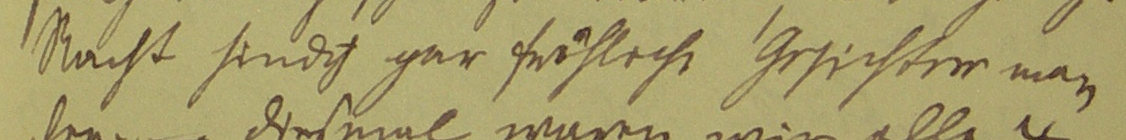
Nacht hindurch gar fröhliche Gesichter ma¬
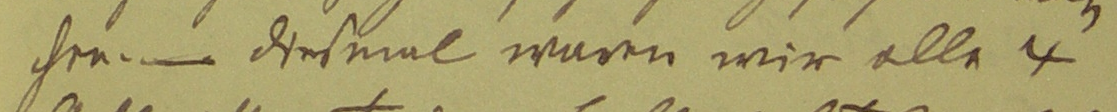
chen. - Diesmal waren wir alle 4
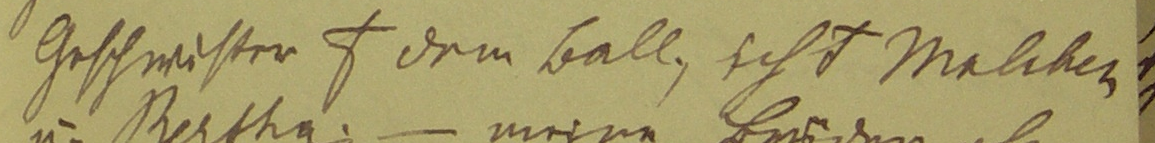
Geschwister auf dem Ball, ich mit Malchen
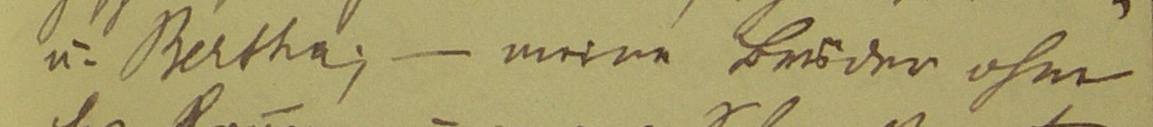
und Bertha; - meine Brüder ohne
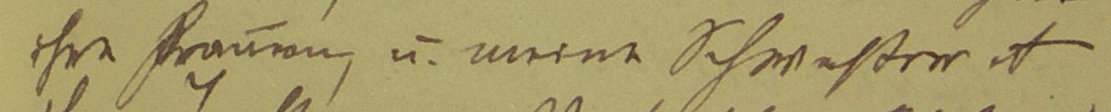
ihre Frauen, und meine Schwester mit
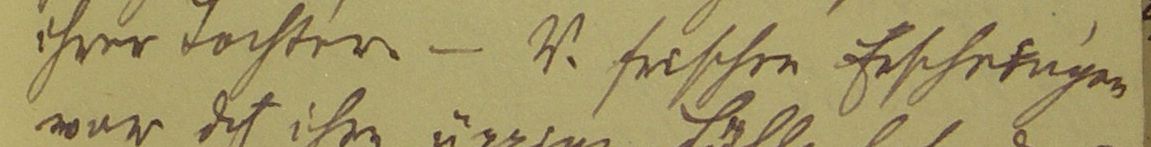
Ihrer Tochter- Von frischen Erscheinungen
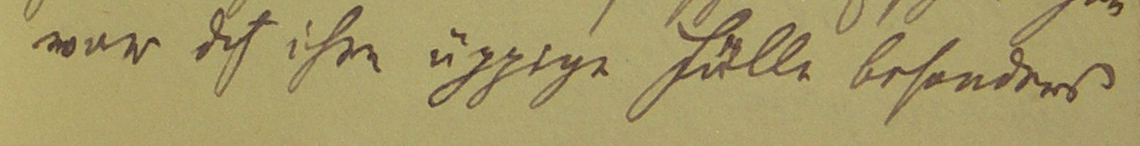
war durch ihre üppige Fülle besonders
